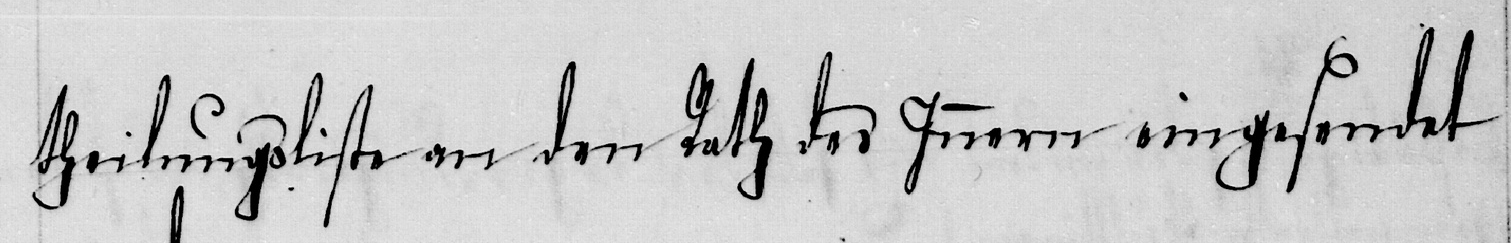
theilungsliste an den Rath des Innern eingesendet
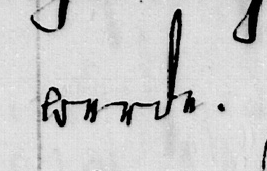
werde.
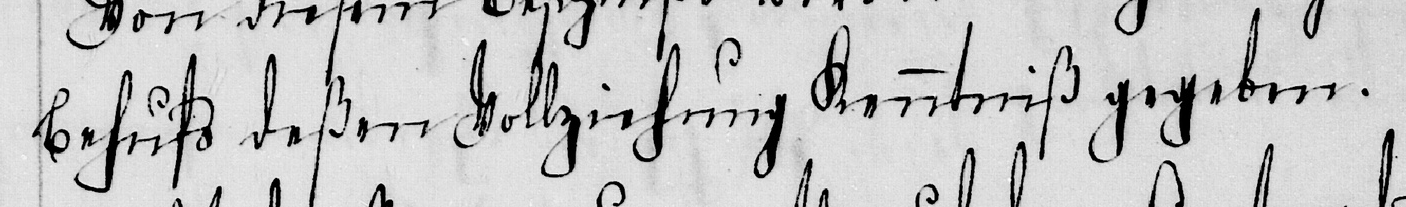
Behufs deßen Vollziehung Kenntniß gegeben.
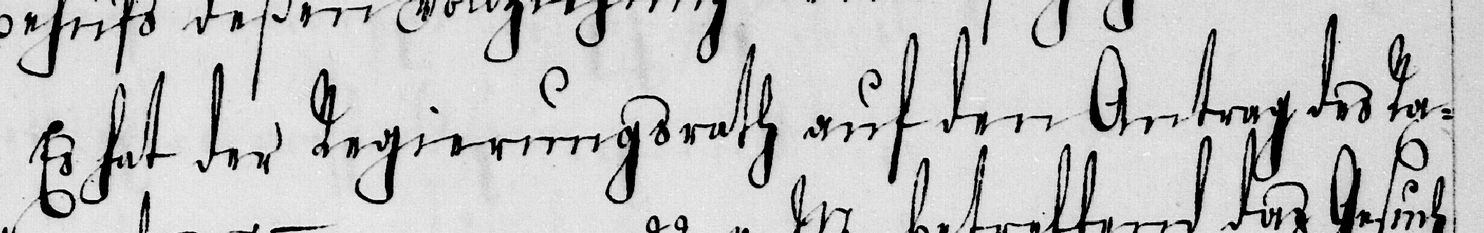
Es hat der Regierungsrath auf den Antrag des Ra¬
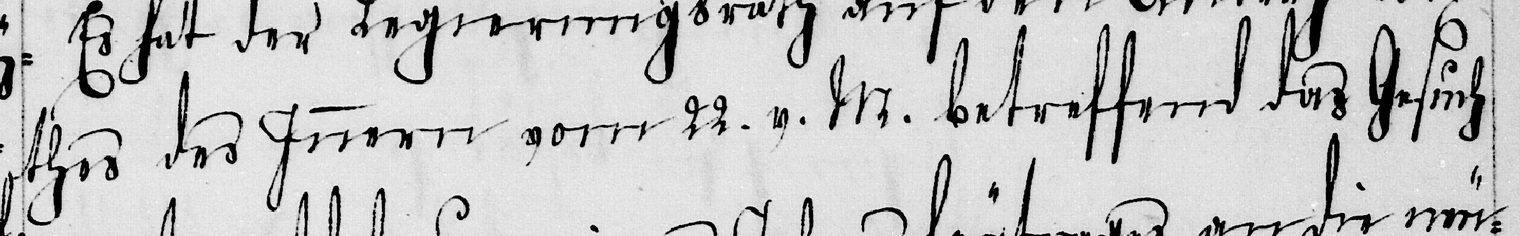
thes des Innern vom 22. v. m. betreffend das Gesuch
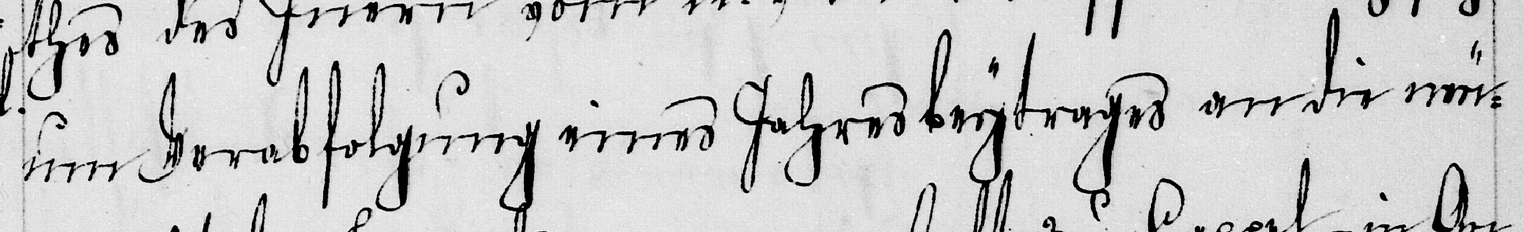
um Verabfolgung eines Jahresbeytrages an die neu
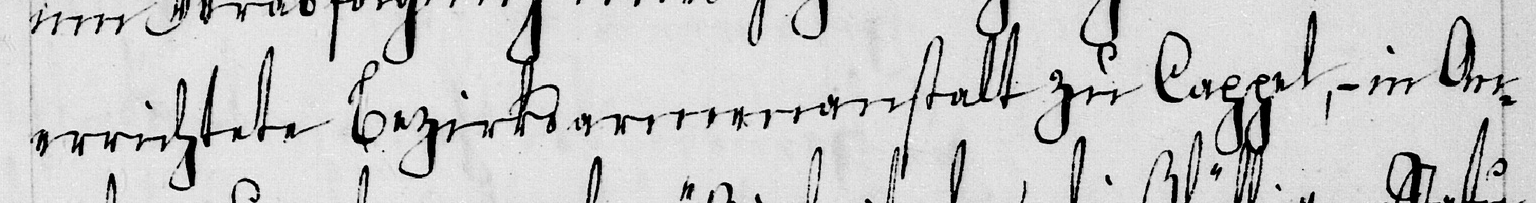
errichtete Bezirksarmenanstalt zu Cappel, – in An¬
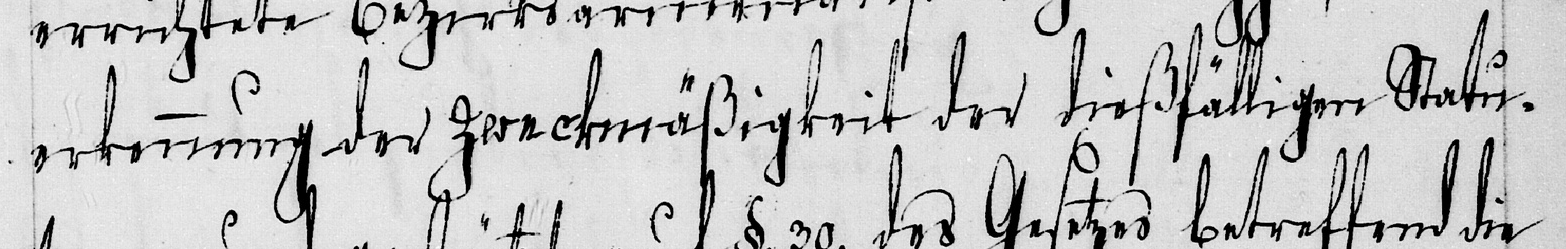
erkennung der Zweckmäßigkeit der dießfälligen Statu¬
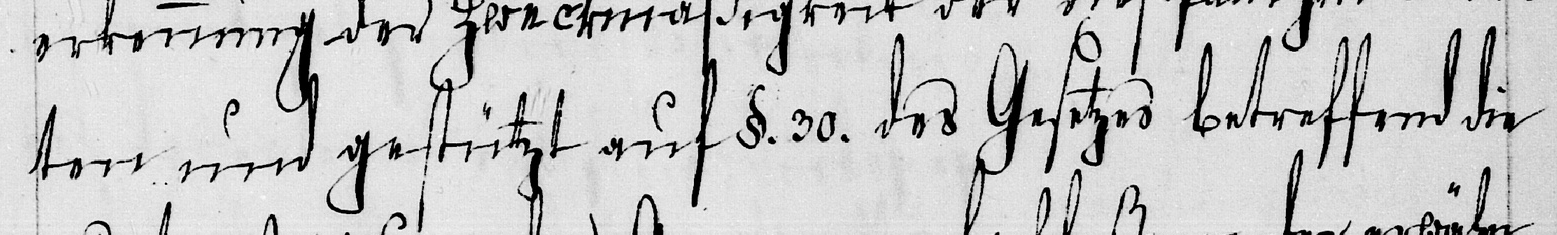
ten und gestützt auf §. 30. des Gesetzes betreffend die
